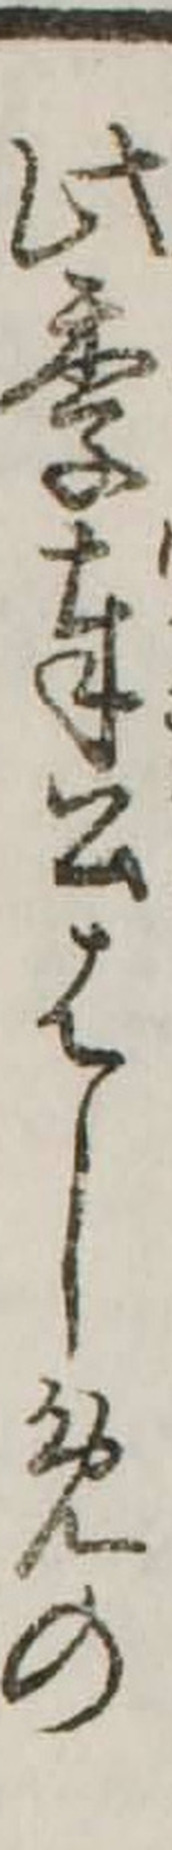此季奉公はしめの
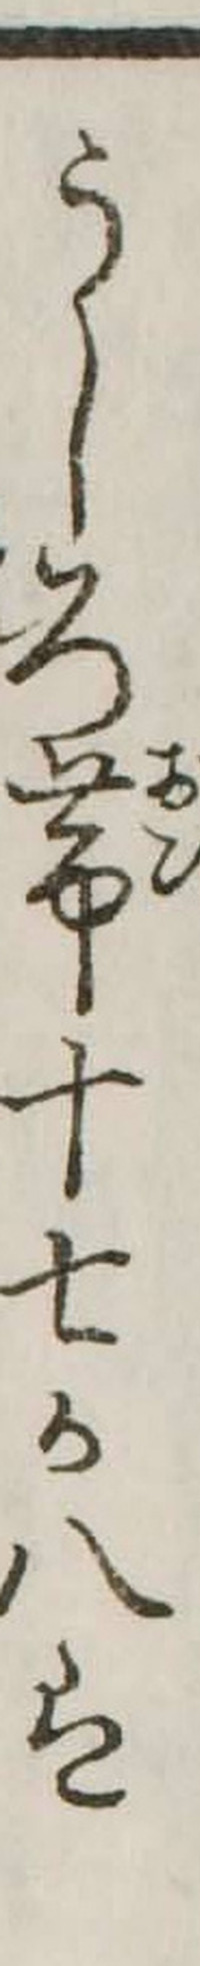うしろ帯十七か八は
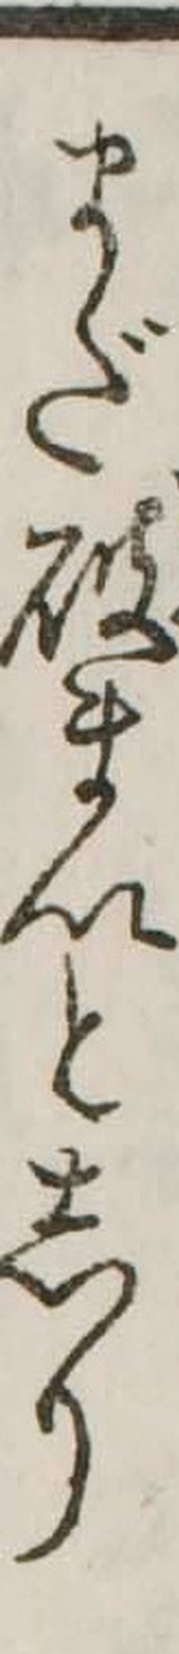まだ破まいとしり
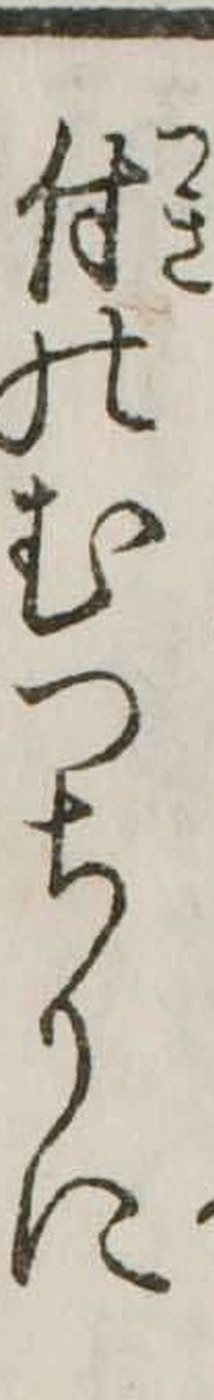付のむつちりに
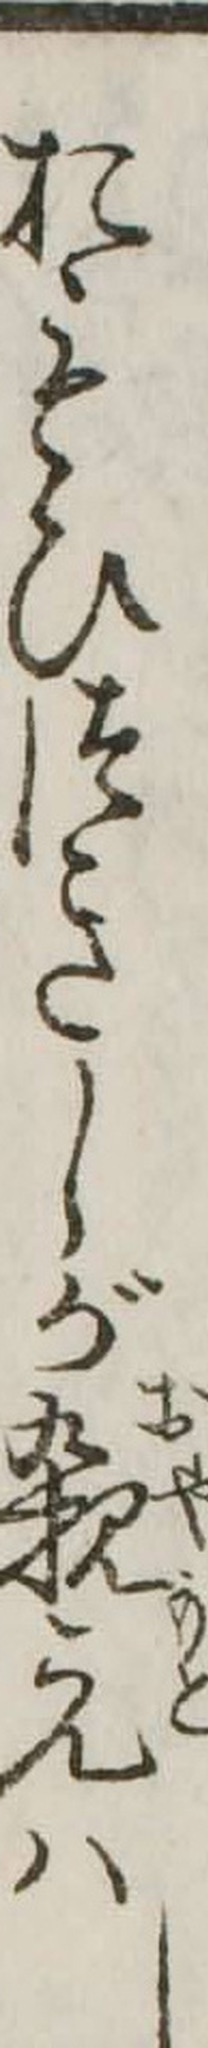おもひつきしが親元は
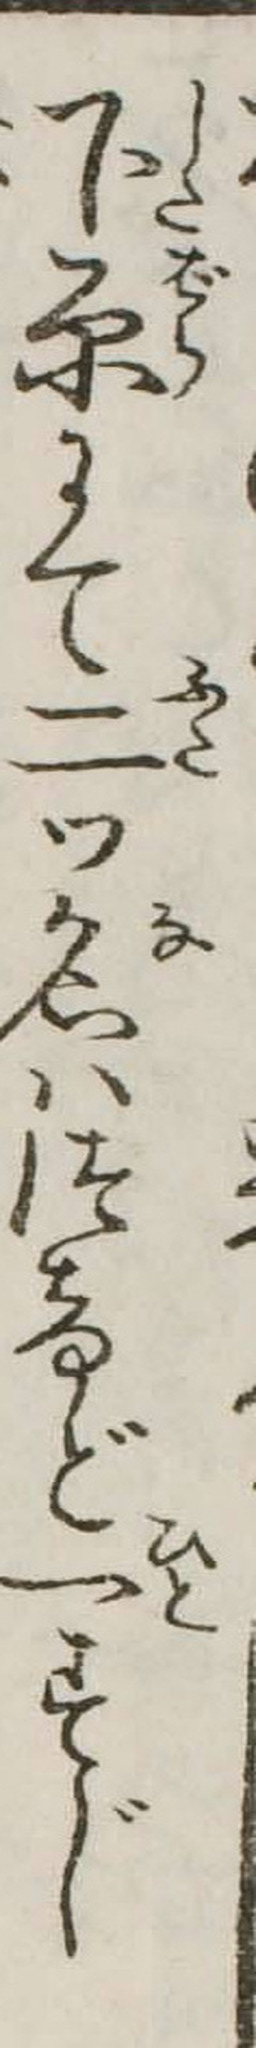下原にて二ッ名はつけど一すじ
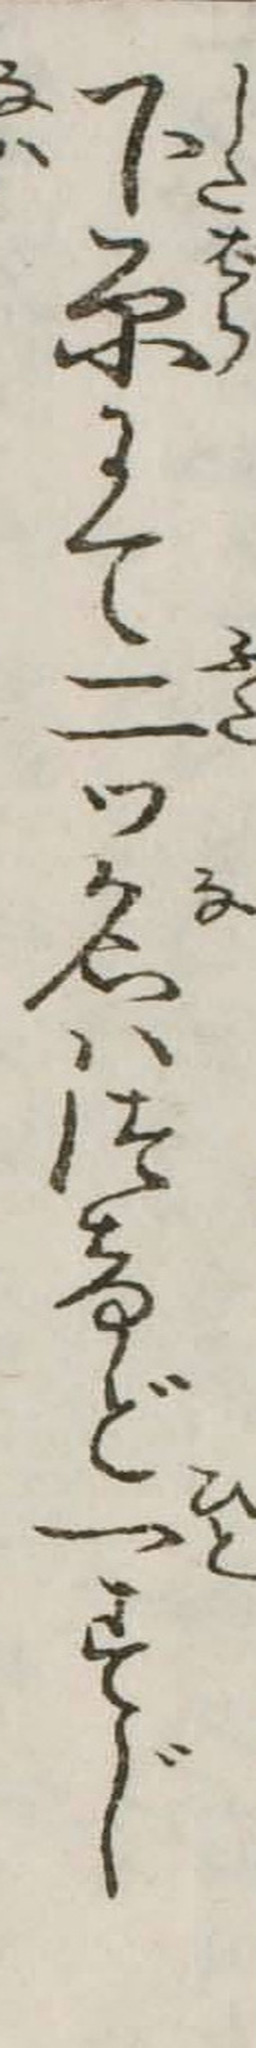下原にて二ッ名はつけど一すじ
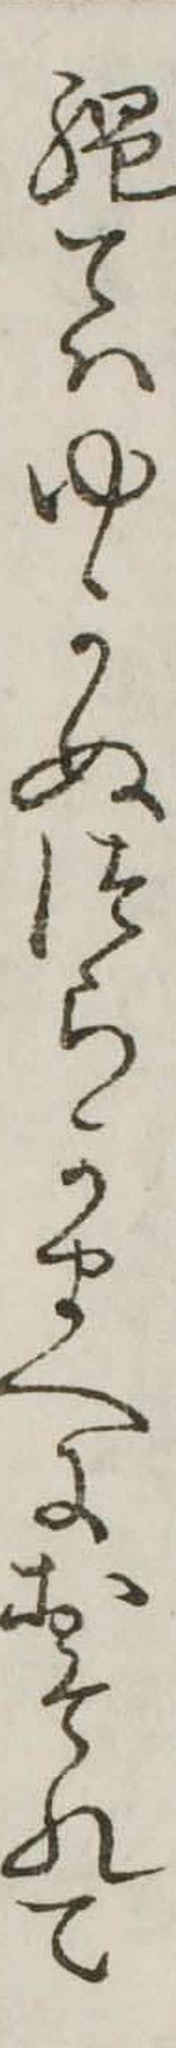縄てはゆかぬつらかまへにおそれて
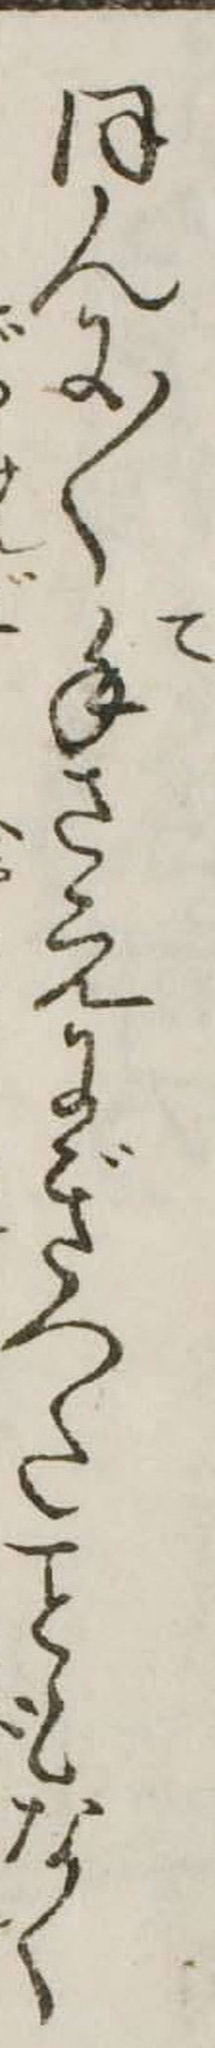ほんに〳〵手さえにぎつたこともなく
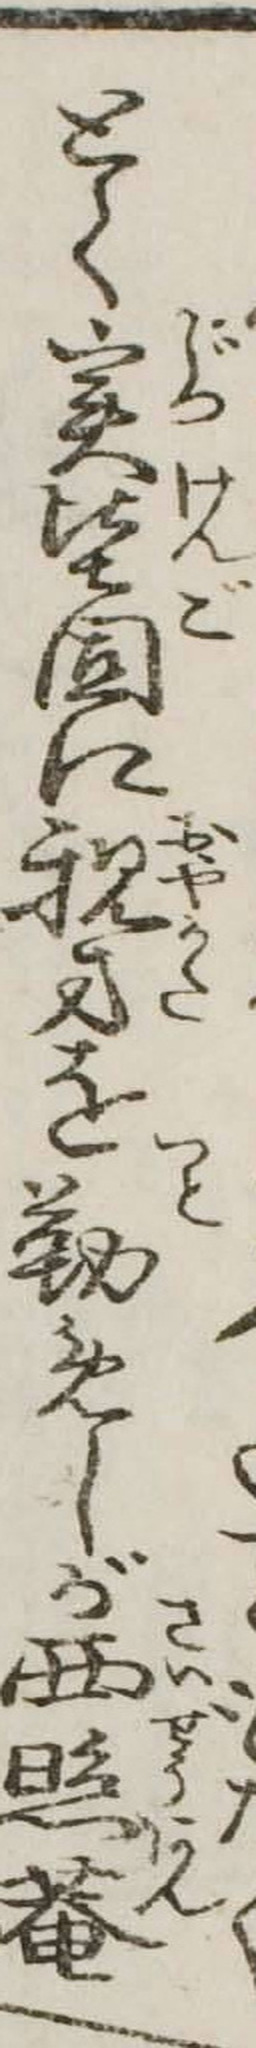とく実堅固に親方を勤めしが西照庵
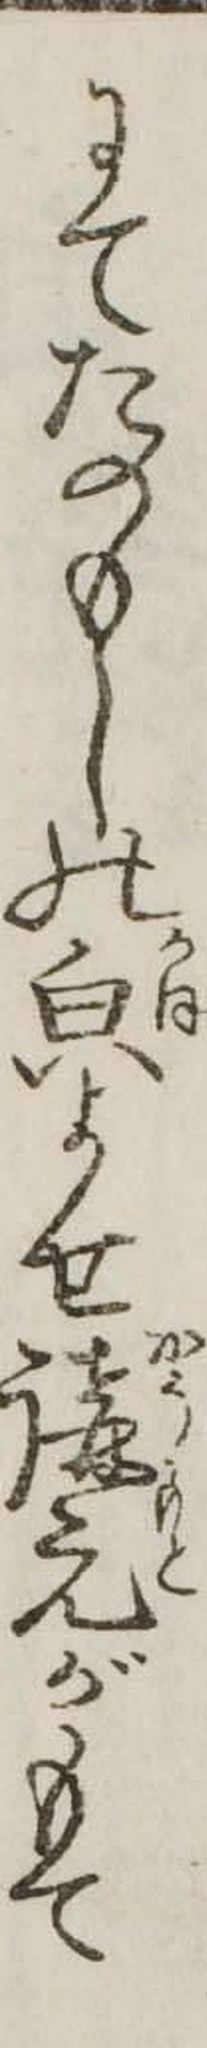にてたのもしの貌よせ講元がもて
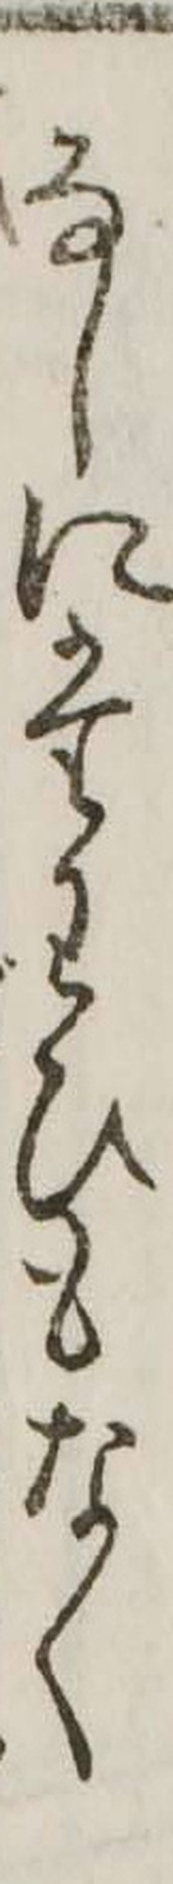なしにたわひもなく
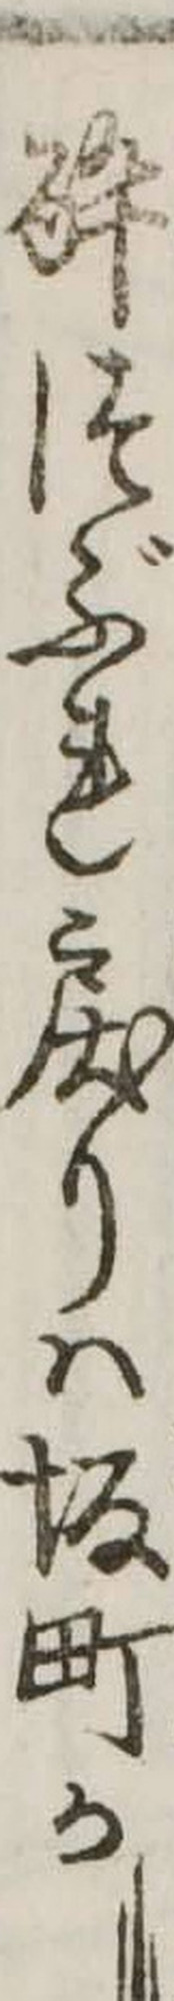酔つぶれ戻りは坂町か
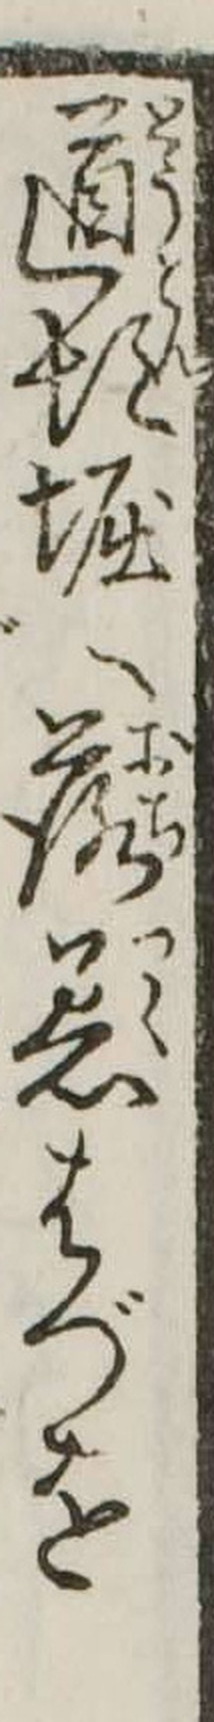道頓堀へ落着はづを
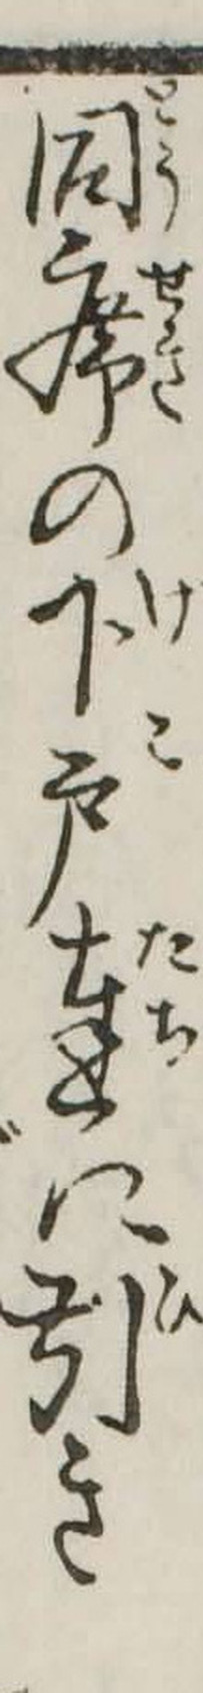同席の下戸達に引き
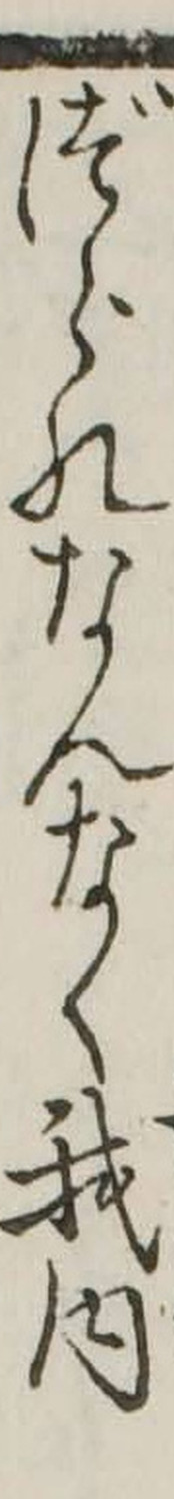づられなんなく我内
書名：繪本不盡泉
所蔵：国文学研究資料館
